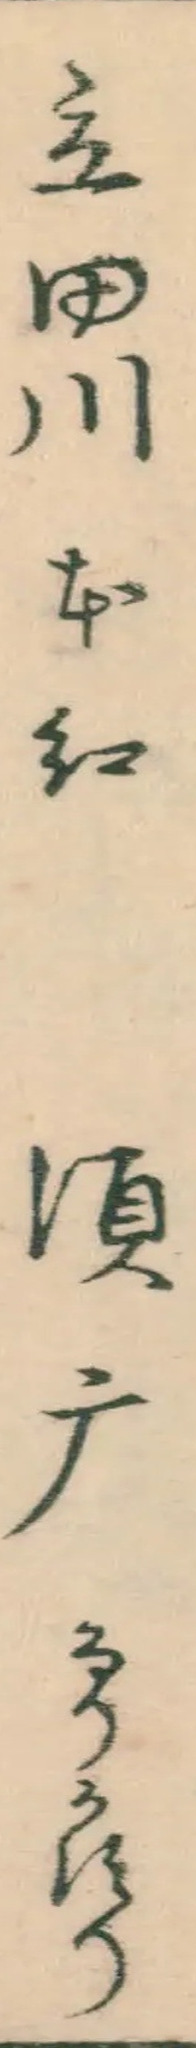立田川本紅須磨るりかすり
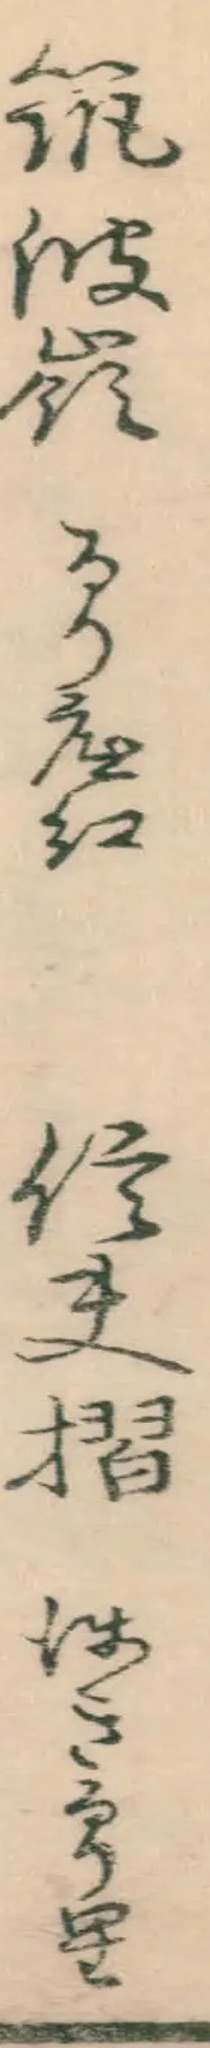筑波嶺るり唐紅信夫摺浅きるり星
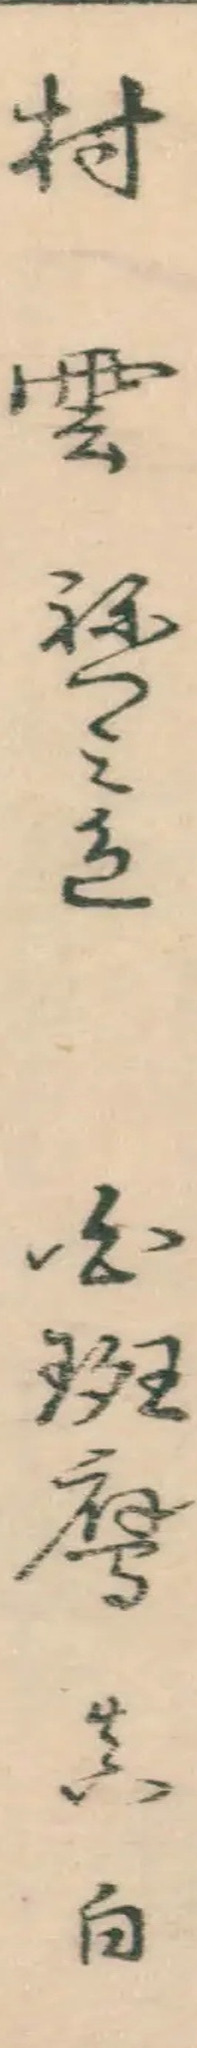村雲ねつみ色斑鷹真白
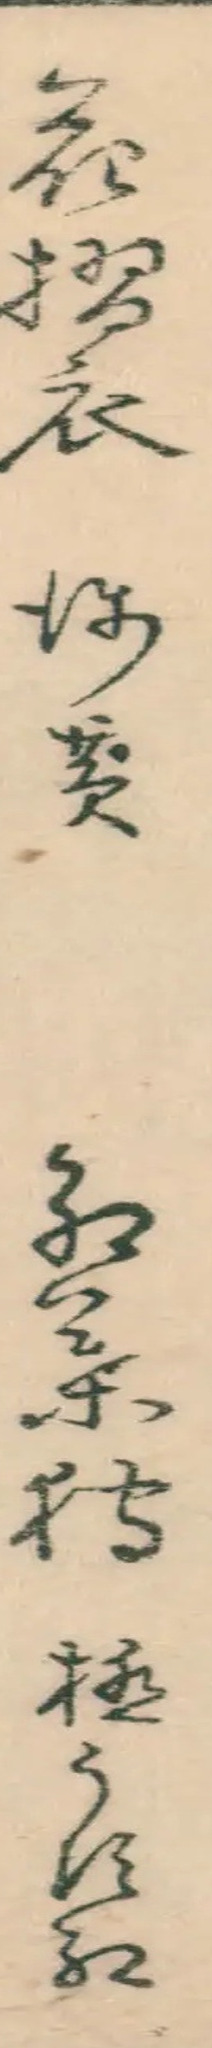花摺衣浅黄紅葉狩極うす紅
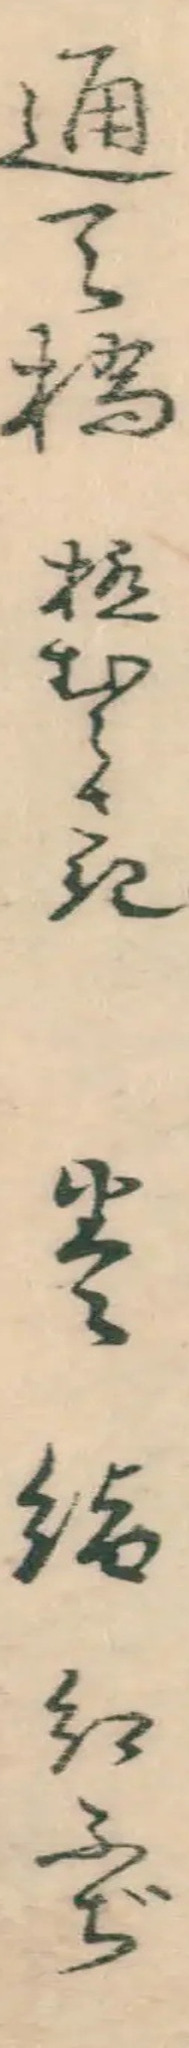通天橋極むらさき巻縮紅ふぢ
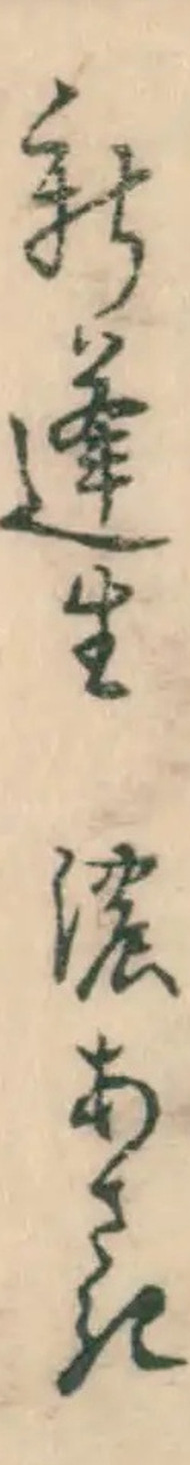新蓬生濃あさき

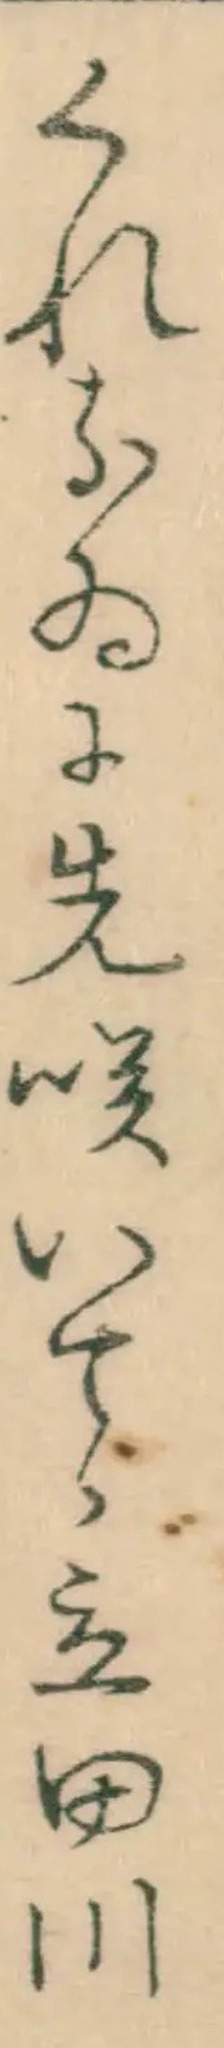くれなゐに先咲いてる立田川
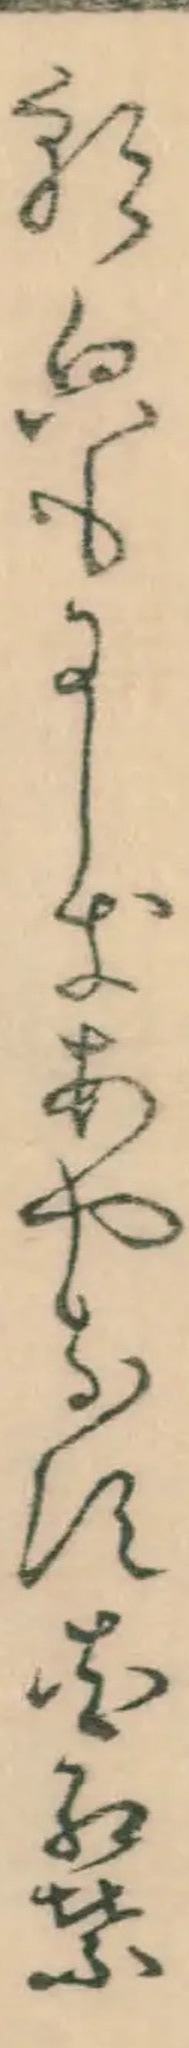朝皃もにしきあやなす花紅紫
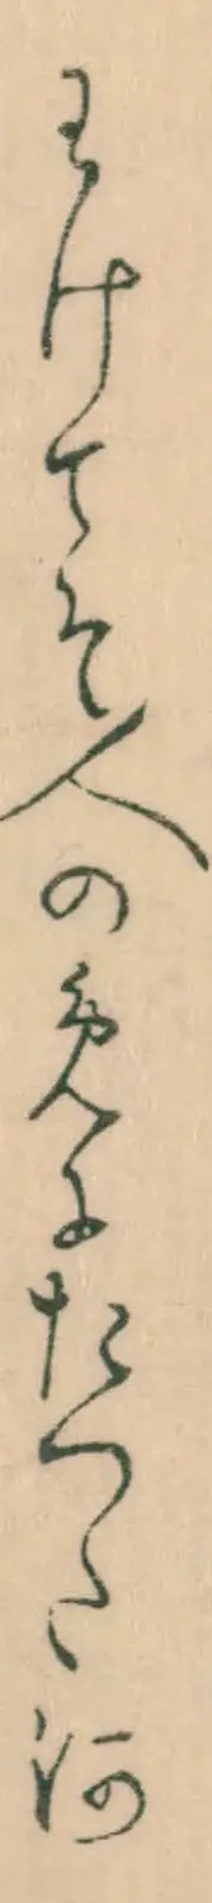わけてそ人のめにたつた河蟹丸
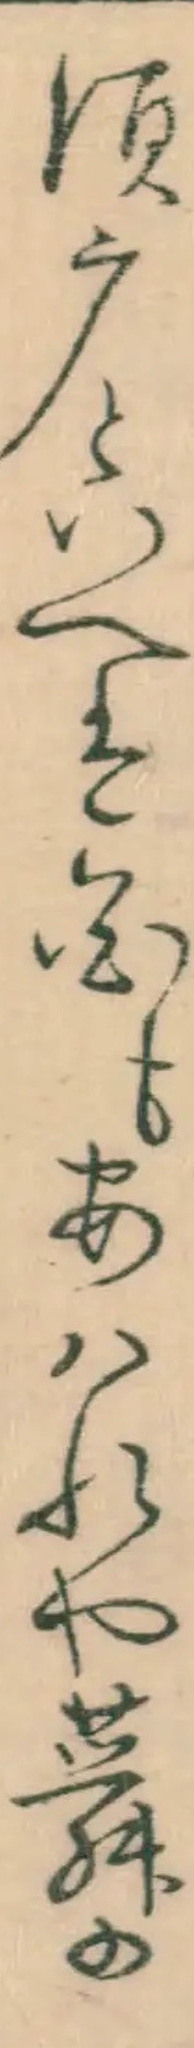須磨といへは花もあはれや蕣の
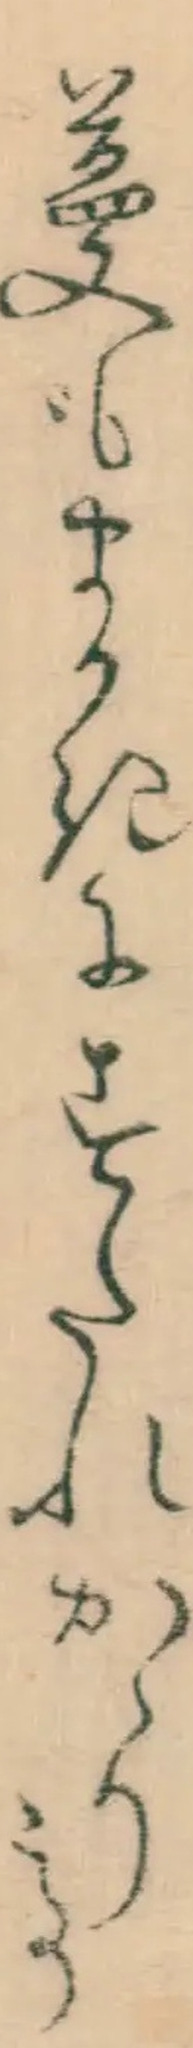蔓もまかきにすたれかかりて仝

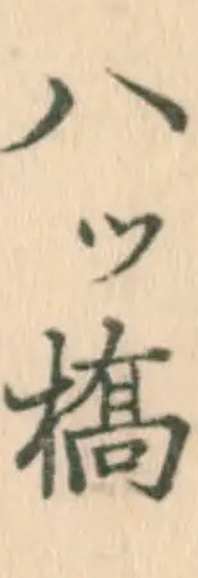八ッ橋
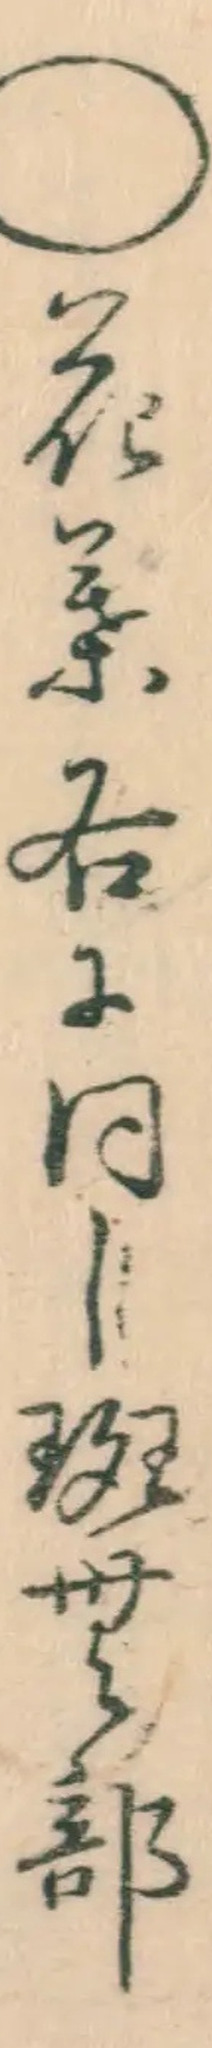○花葉右に同し斑無部
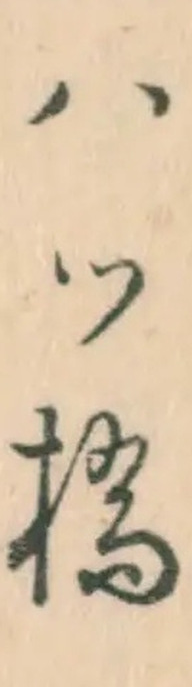八ッ橋
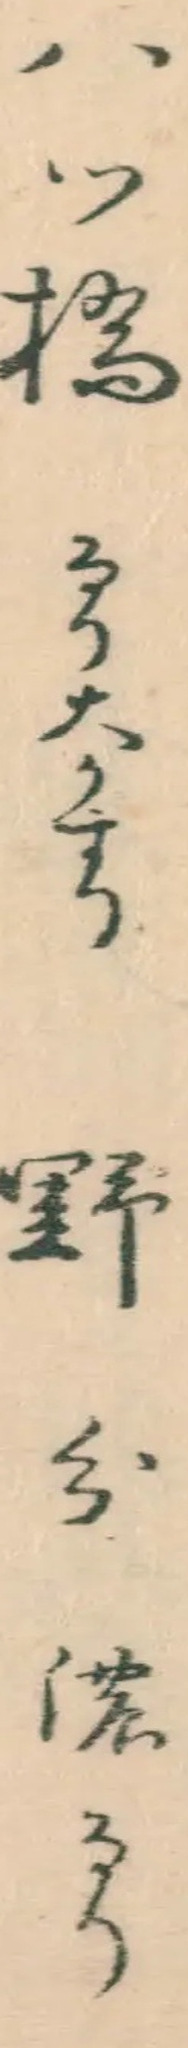八ッ橋るり大かすり野分濃るり
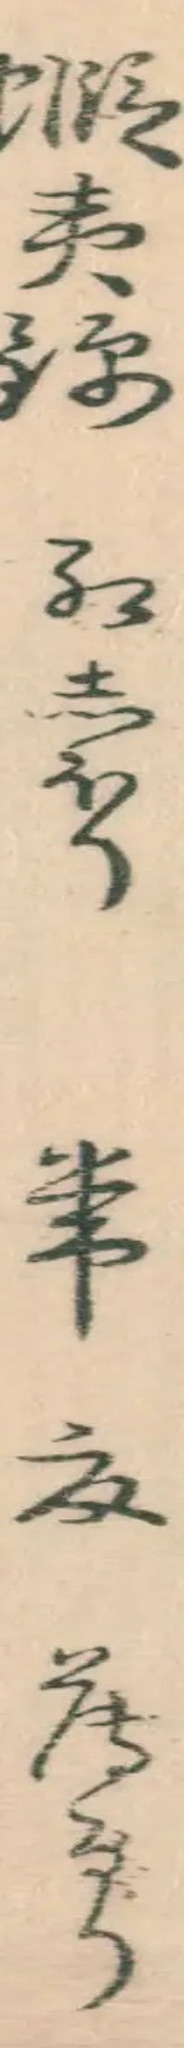蝦夷錦紅しほり常夏薄るり
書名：花壇朝顔通 2巻. [1]
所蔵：国立国会図書館 National Diet Library, JAPAN
